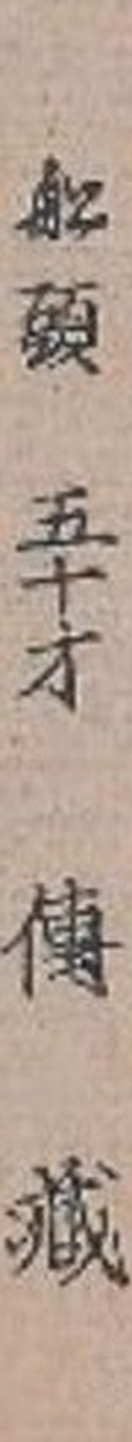船頭五十歳伝蔵
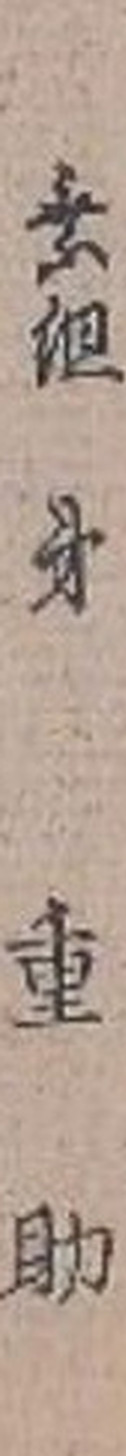乗組弟重助
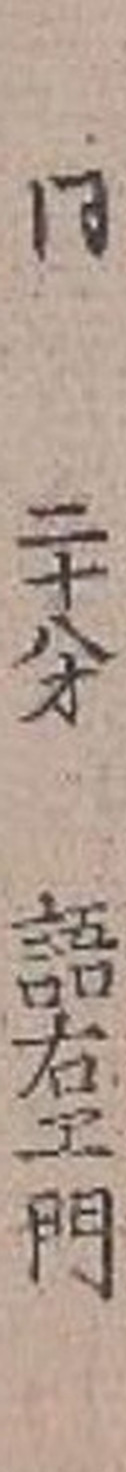同二十八才語右ヱ門
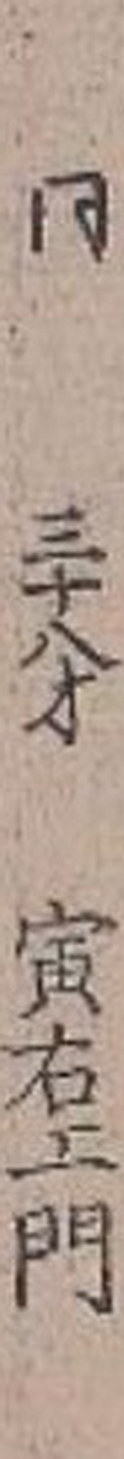同三十八才寅右ヱ門
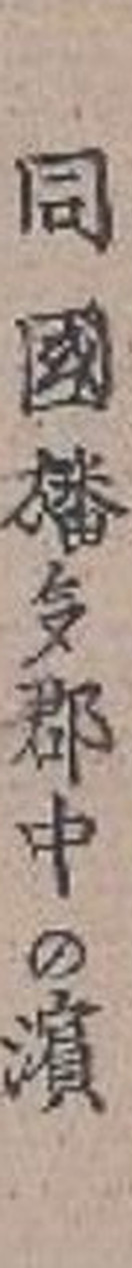同国旙多郡中の浜
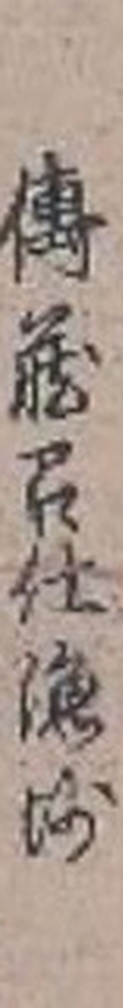伝蔵召仕漁師
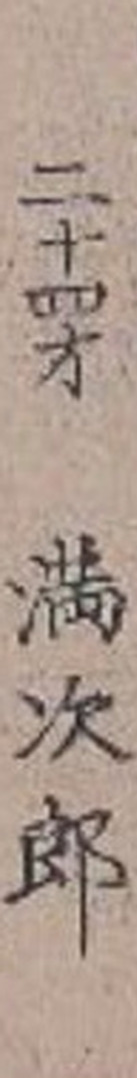二十四才満次郎
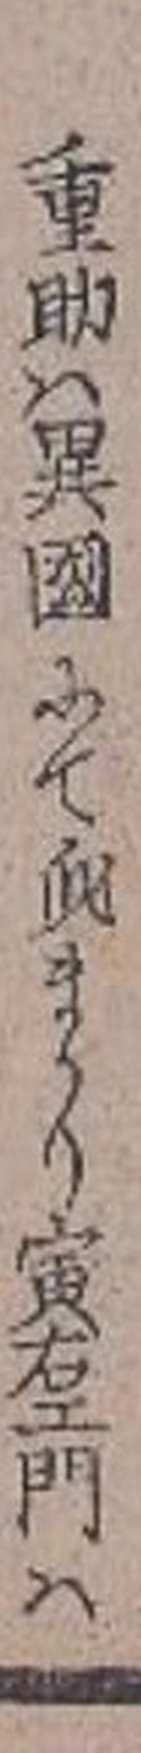重助は異国にて身まかり寅右ヱ門は
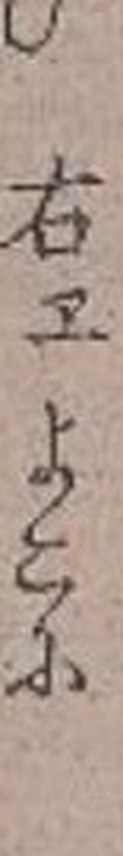右ヱよこに
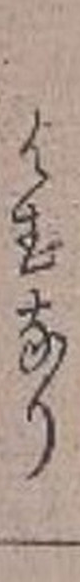よむなり
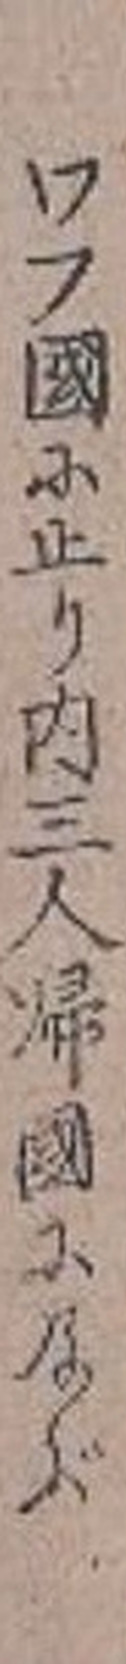ワフ国に止り内三人帰国に及ぶ
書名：満次郎漂流記
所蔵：University of the Ryukyus Library
